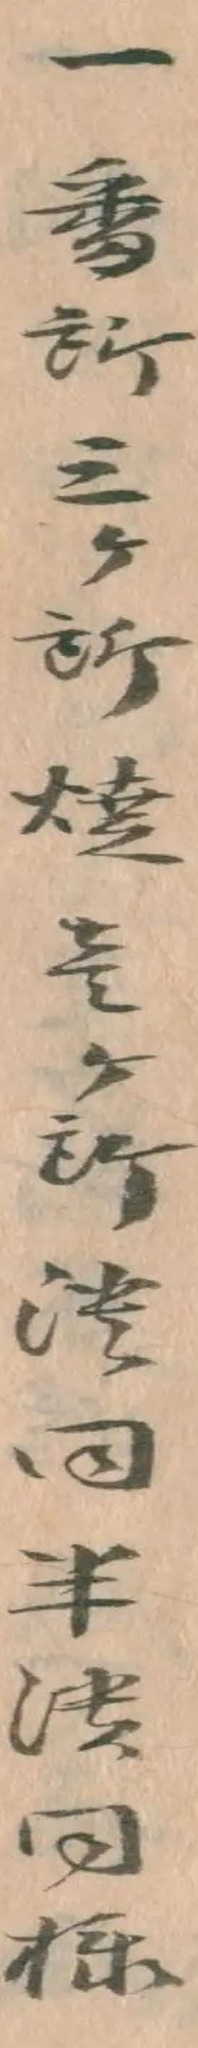一番所三ヶ所焼壱ヶ所潰同半潰同様

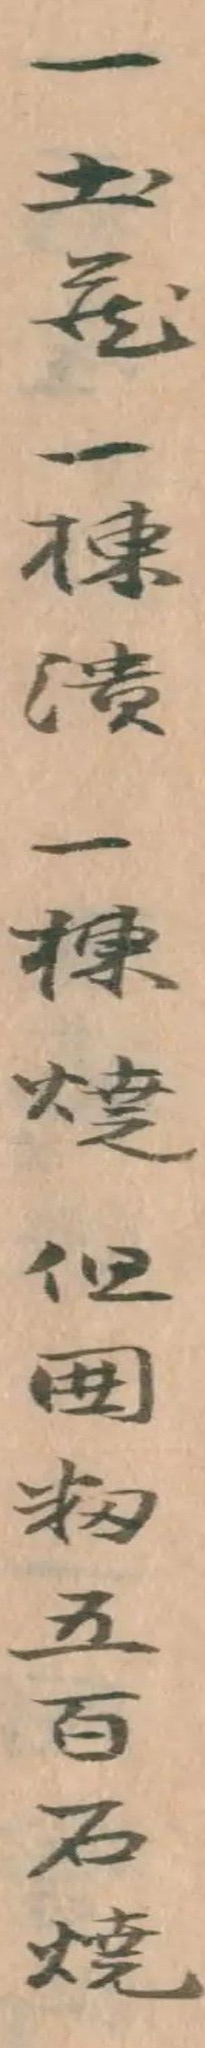一土蔵一棟潰一棟焼但囲籾五百石焼
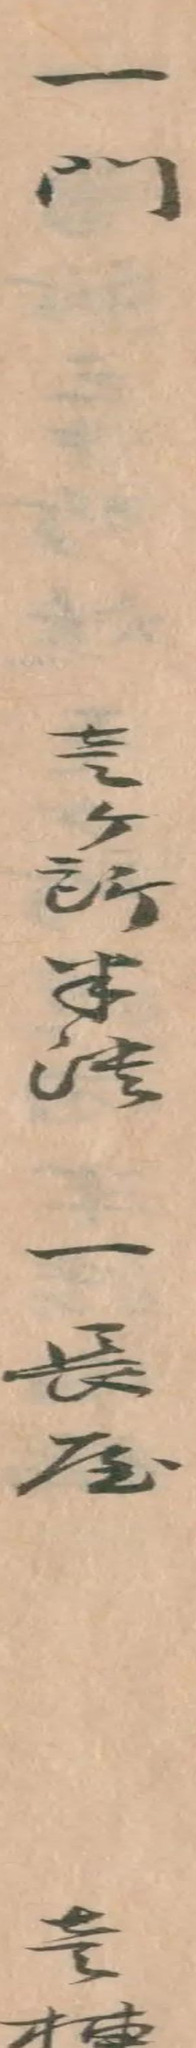一門壱ヶ所半潰一長屋一棟潰
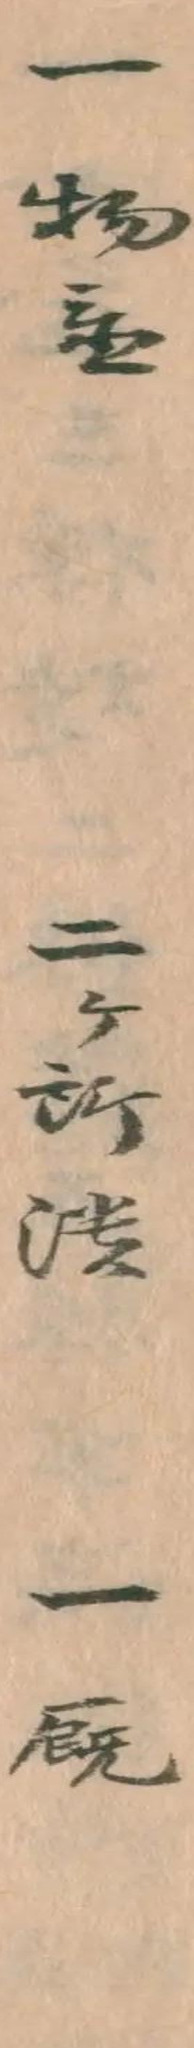一物置二所潰一厩一所半潰
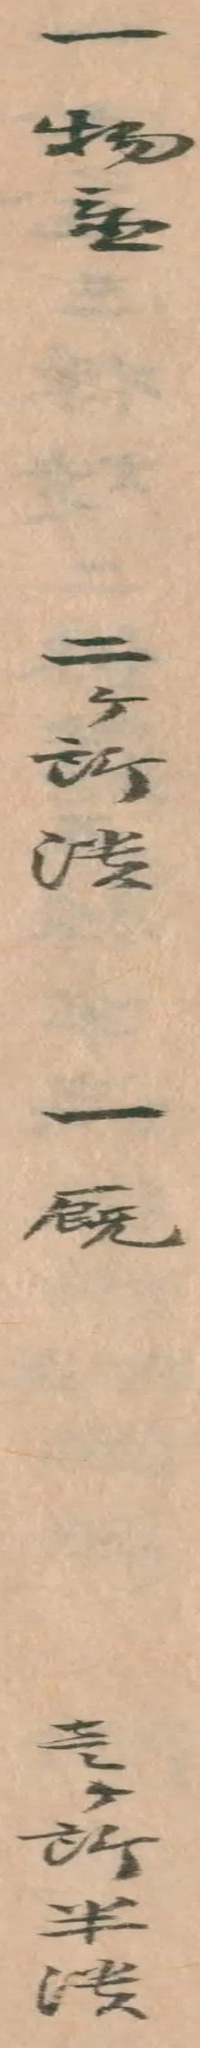一物置二所潰一厩一所半潰
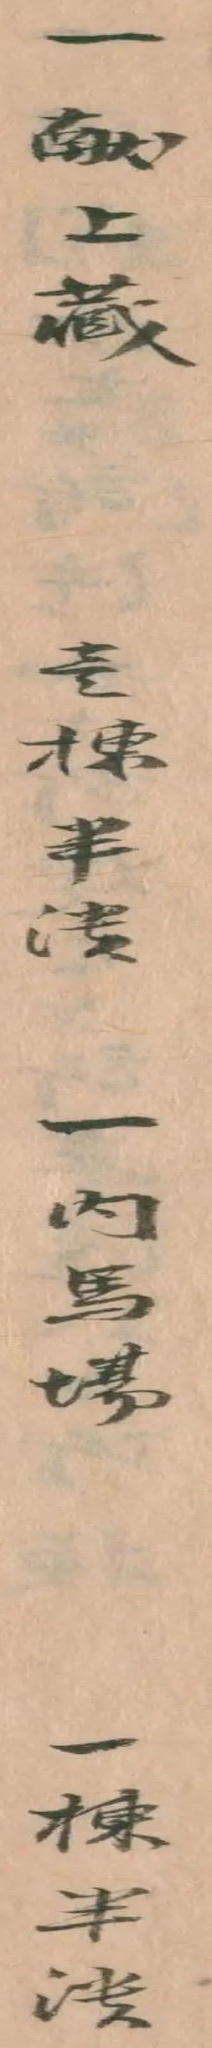一献上蔵壱棟半潰一内馬場一棟半潰
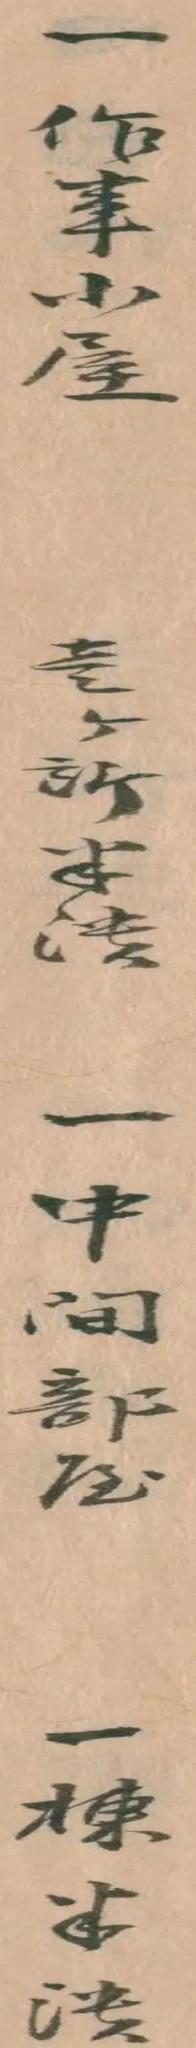一作事小屋壱ヶ所半潰一中間部屋一棟焼
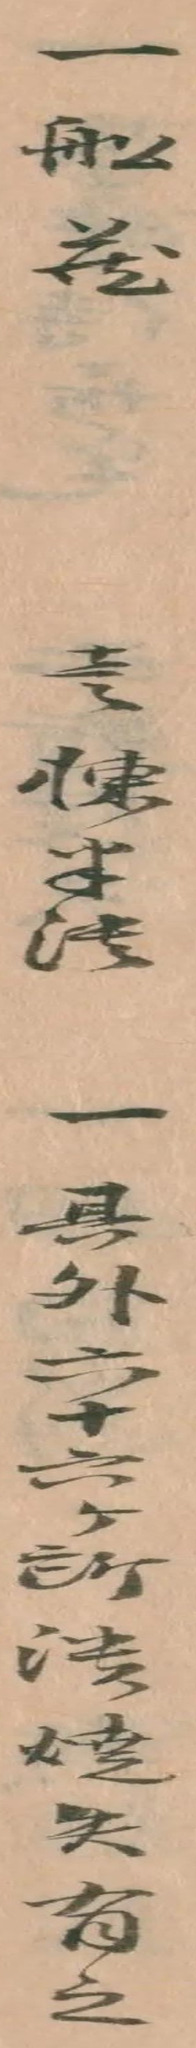一船蔵壱棟半潰一其外六十六ヶ所潰焼失有之
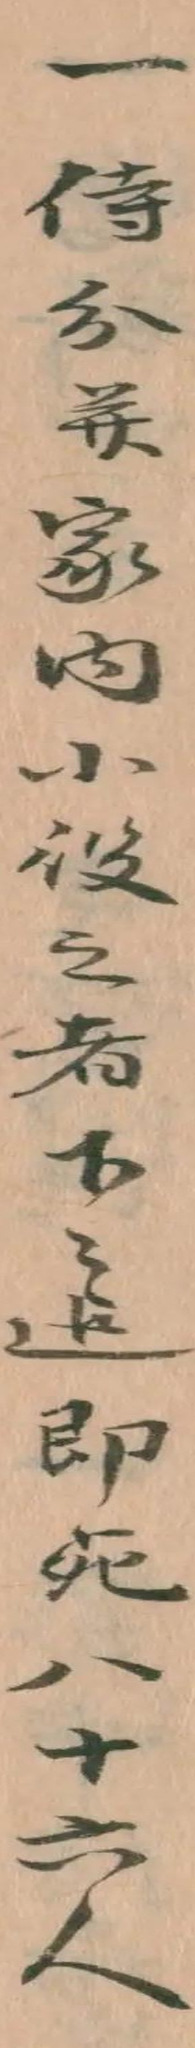一侍分并家内小役之者下々迄即死八十六人
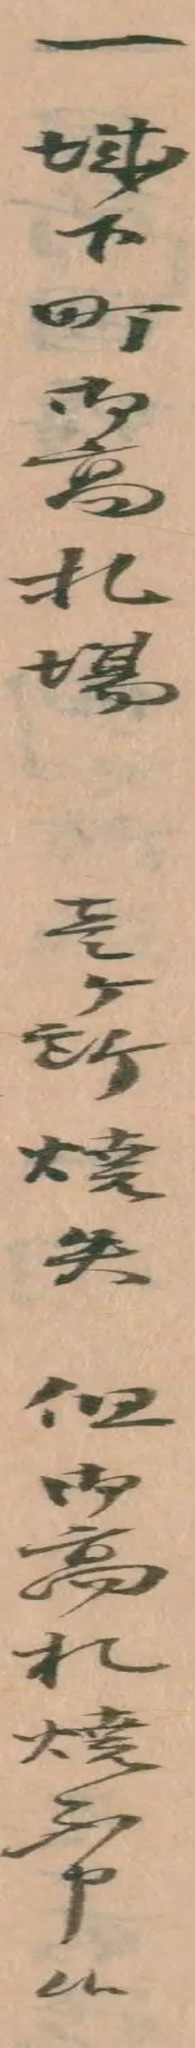一城下町御高札場壱ヶ所焼失但御高札焼不申候
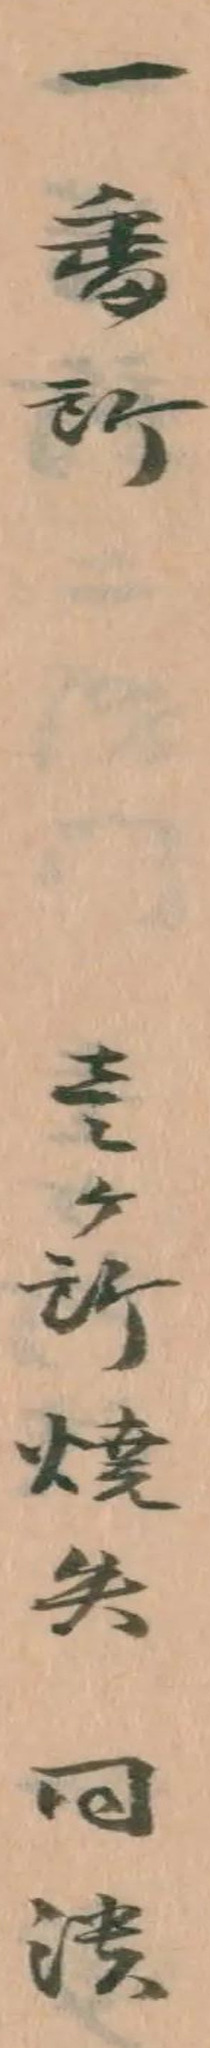一番所壱ヶ所焼失同潰
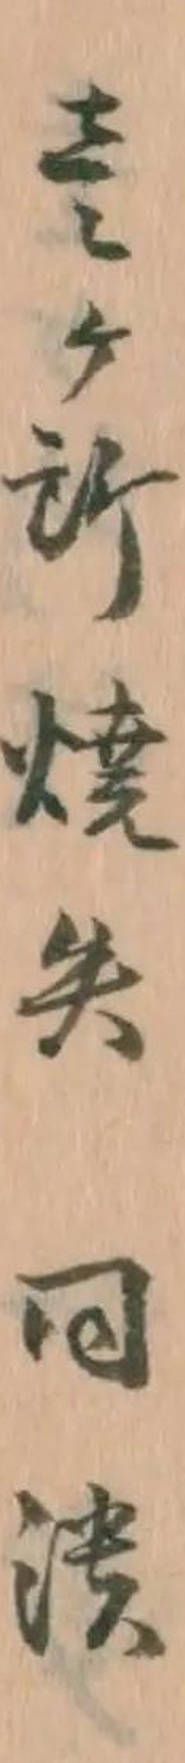一番所壱ヶ所焼失同潰
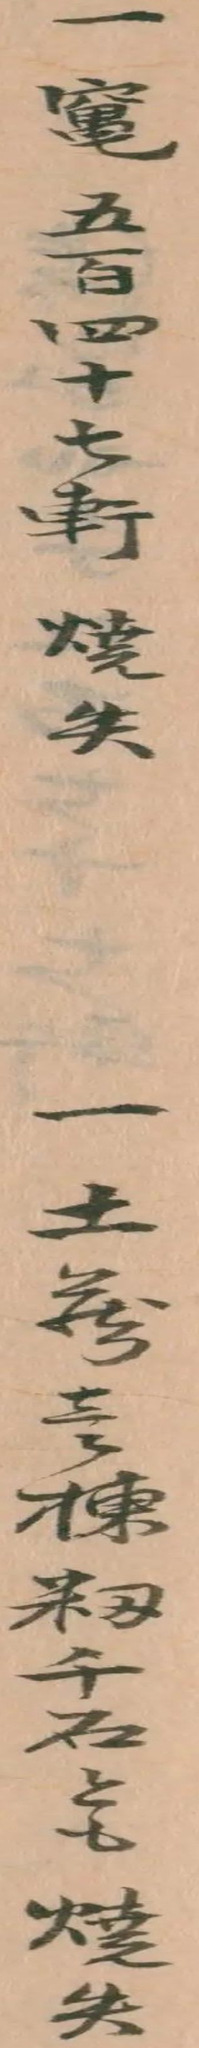一竈五百四十七軒焼失一土蔵壱棟籾千石とも焼失
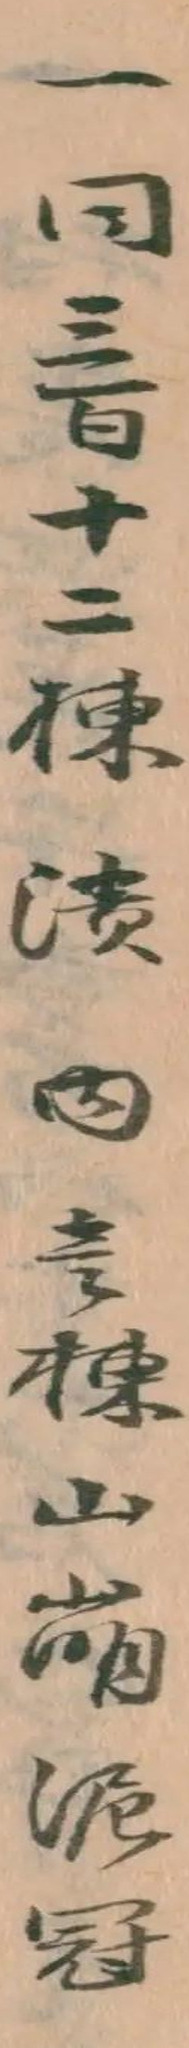一同三百十二棟潰内壱棟山崩泥冠
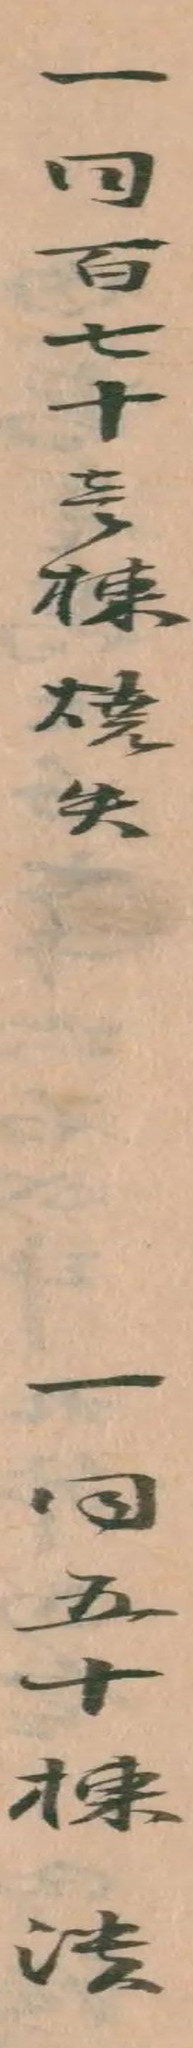一土蔵百七十壱棟焼失一同五十棟潰
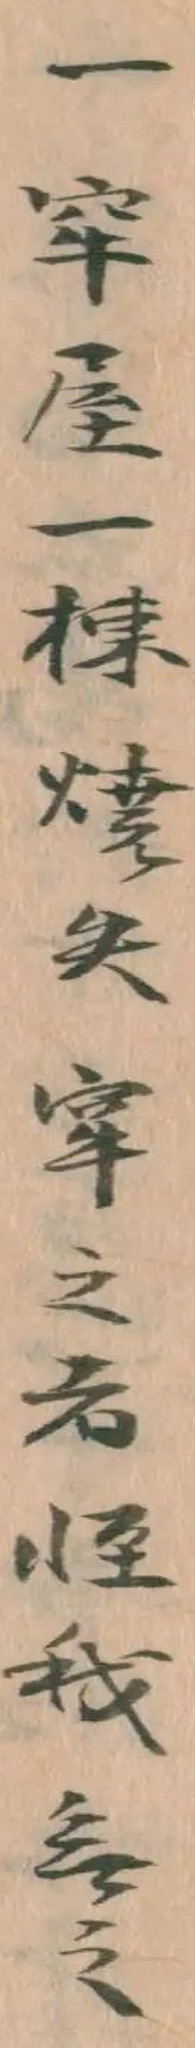一牢屋一棟焼失牢之者怪我無之
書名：地災撮要. 巻3(地震之部)-巻4(噴火之部)
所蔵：国立国会図書館 National Diet Library, JAPAN
